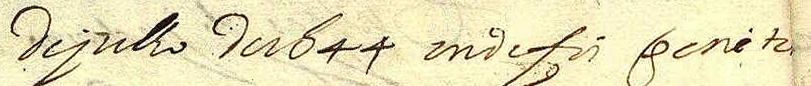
de julho de 1644 onde foi penite
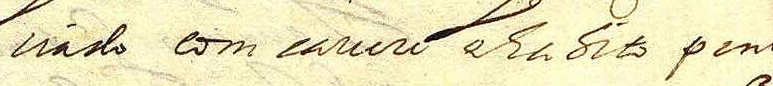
ciado com carcere e habito peni
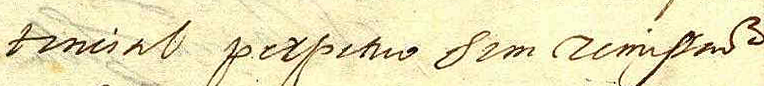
tencial perpetuo sem remissaõ
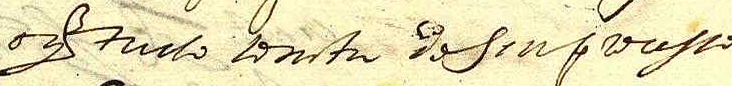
o q̄ tudo consta do seu processo
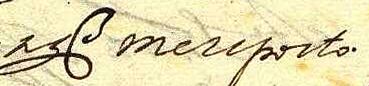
a q̄ me reporto.
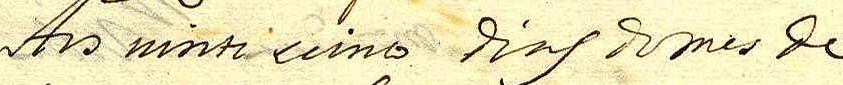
Aos vinte cinco dias do mes de
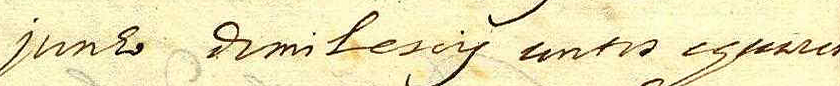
junho de mil e seis centos e quaren
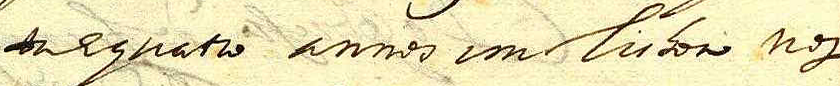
ta e quatro annos em lisboa nos
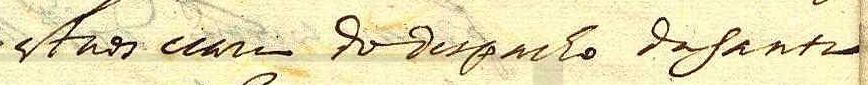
estaos e caza do despacho da Santa
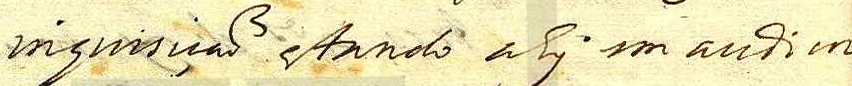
inquisiçaõ estando ahj em audien
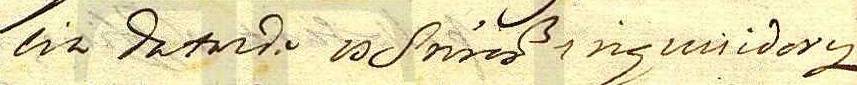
cia da tarde os snr̄es inquisidores
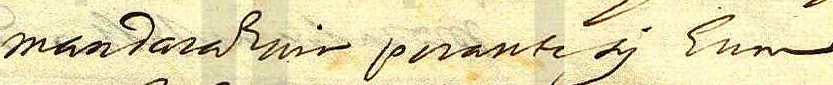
mandaraõ uir perante sj hum
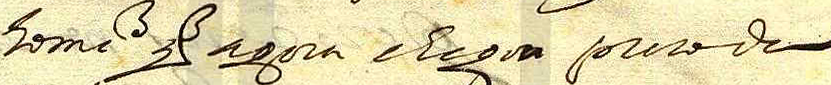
homē q̄ agora chegou prezo da
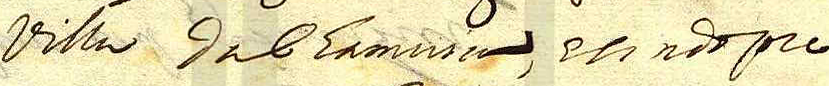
Villa da Chamusca, e sendo pre
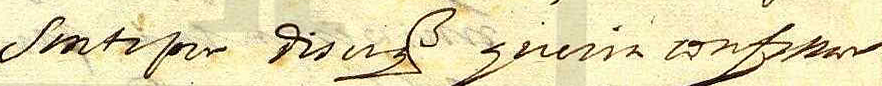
sente por diser q̄ queria confessar
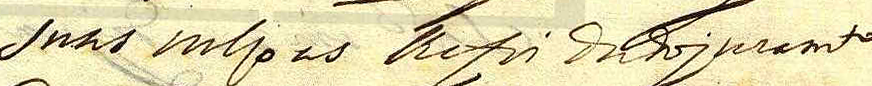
suas culpas lhe foi dado juramto
